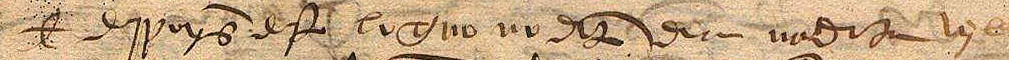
E despoys desto loguo no dito dia na dita vylla
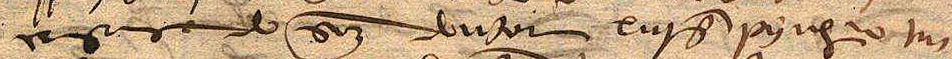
e casas do s̄or doutor lujs pynhro jm
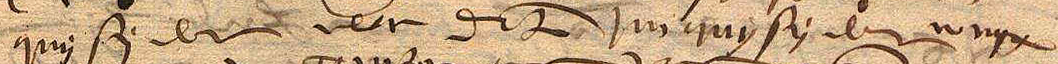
quysydor elle dito Jmquysydor comjgo
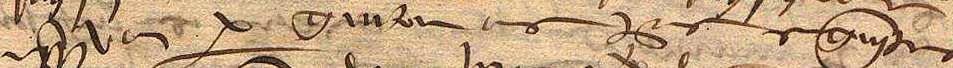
esp̄vam ꝑguntou as tsas seḡujtes
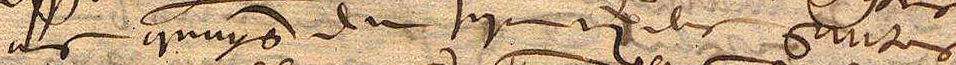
as quays deu Juramto dos santos
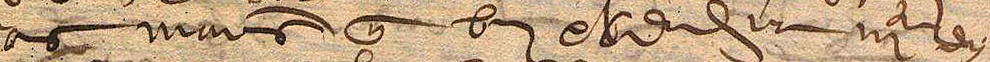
as mãos q̄ bem e ꝟdadjramte dy
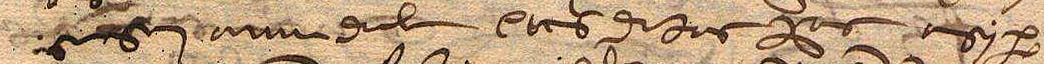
sesem a uerdade e as ditas tsas asy ho
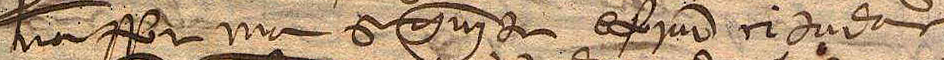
na fforma seḡujte e forão citadas ꝑ
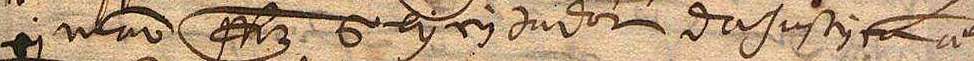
symão f̄frz solycytador da Justyca ao
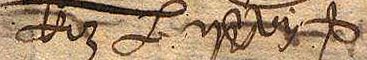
R̄iz ho esp̄vy
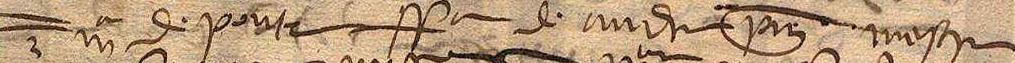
item ma de ponte ffa de andre p̄iz mestre
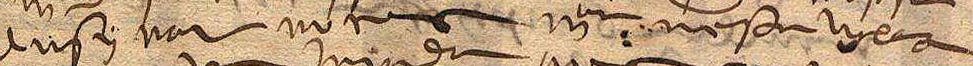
densynar mocos mor nesta vylla
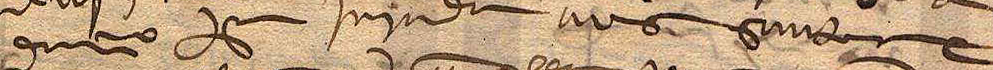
dauro tsa Jurada aos santos e
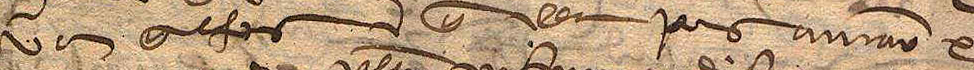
vamgelhos ē q̄ ella pos a mão e
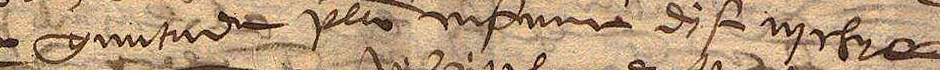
ꝑguntada p̄llo custume dyse njchyl
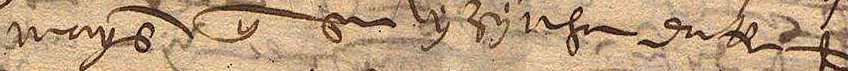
mays q̄ ser vyzynha da Re
